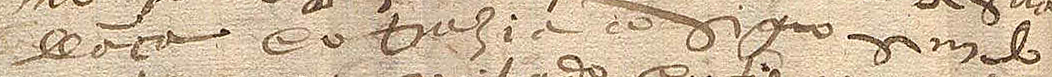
llāça e o trazia c̄osiguo semdo
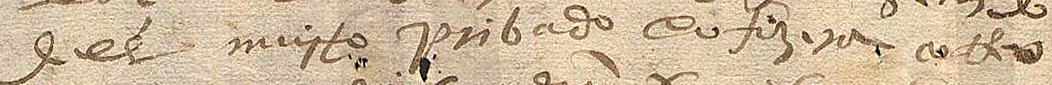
delle mujto privado e o fizera coReo
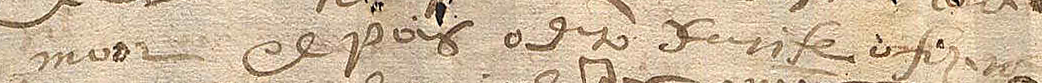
moor e depois o dito xarife o fizera
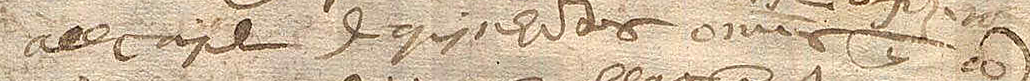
allcajde de qujnhētos omēs q̄ cō
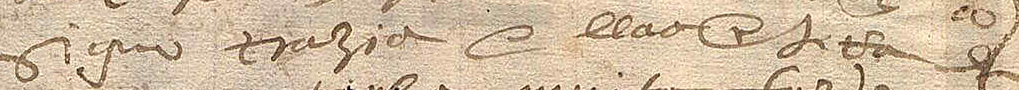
siguo trazia e llaa ē teRa de
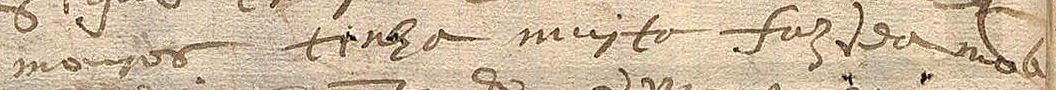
mouros tinha mujta fazēda mov
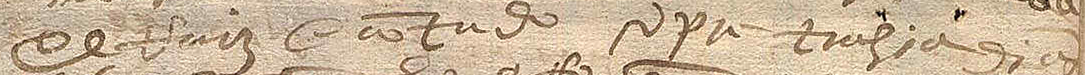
e de Raiz e cōtudo sēpre trasia diāt
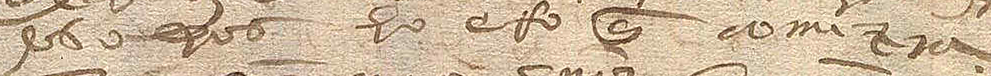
dos olhos ho eRo q̄ cometera
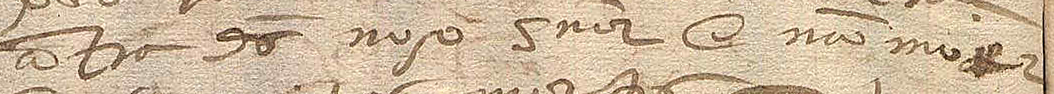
c̄otra ds̄ noso Snōr e não moRer
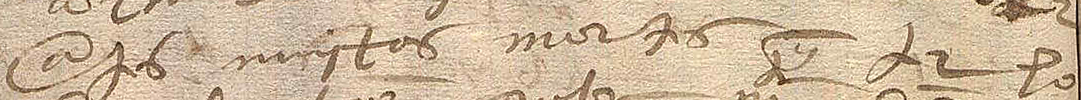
ātes mujtas mortes q̄ ter ho
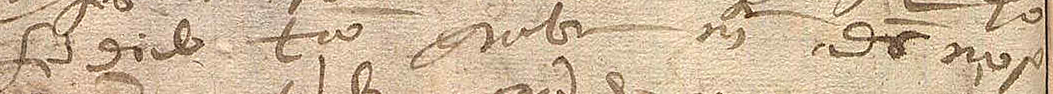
fēdido taõ gravemte a ds̄ noso
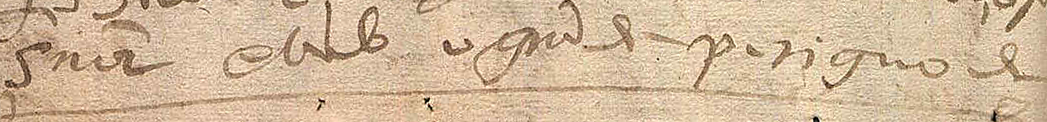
Snōr e vēdo o grāde periguo de
